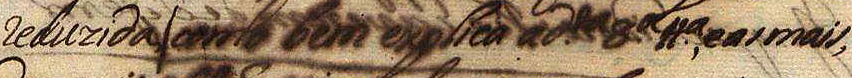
Reduzida/ como bem explica a d.ta 8.a tt.a, e as mais,
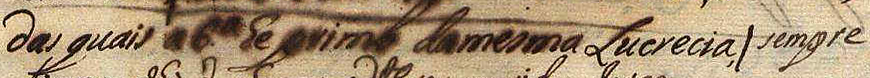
das quais a 6.a he primo da mesma Lucrecia,/ sempre
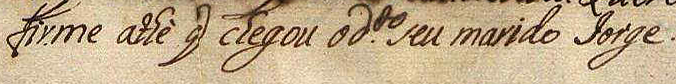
firme atè q̄ chegou o d.to seu marido Iorge.
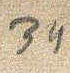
34
